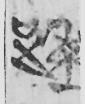踵
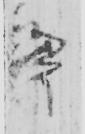弓
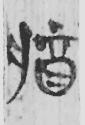𨟻（將）
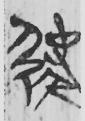{弓夬矢}
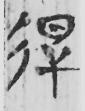{彳日干}
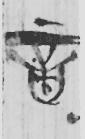音
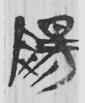陽
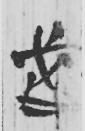武
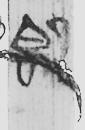即
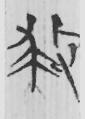救
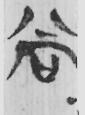尚
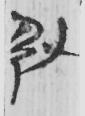引
